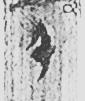千
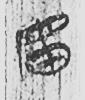{母田}
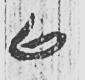㠯（以）
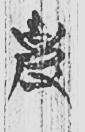尅
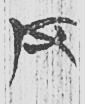反
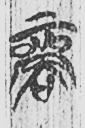商
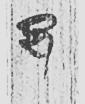邑
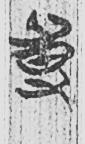尃
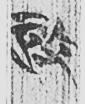政
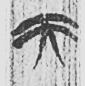天
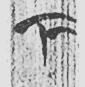下
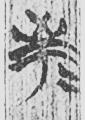{至于}=
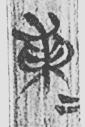{木𦥑}=
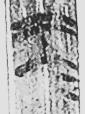王=
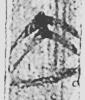大
